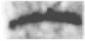一
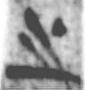之
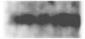一
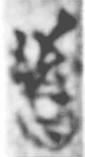晉
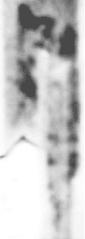杸
